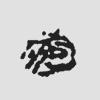失
